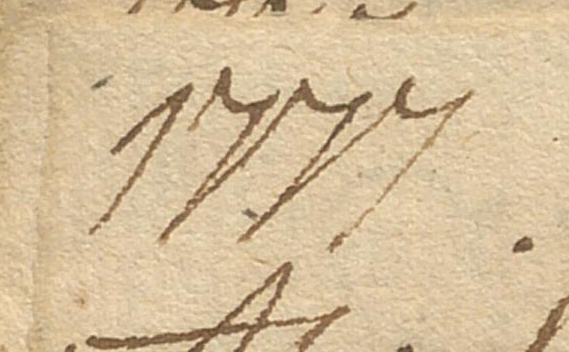1777
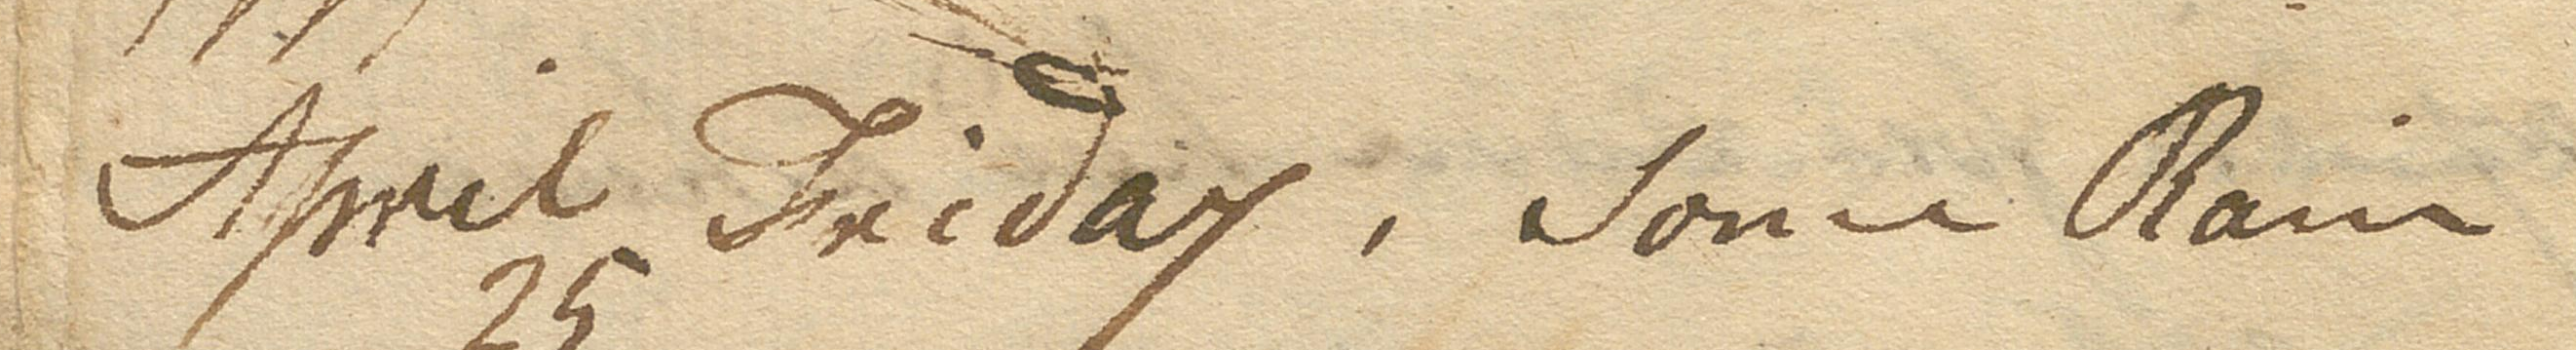April, Friday. some Rain
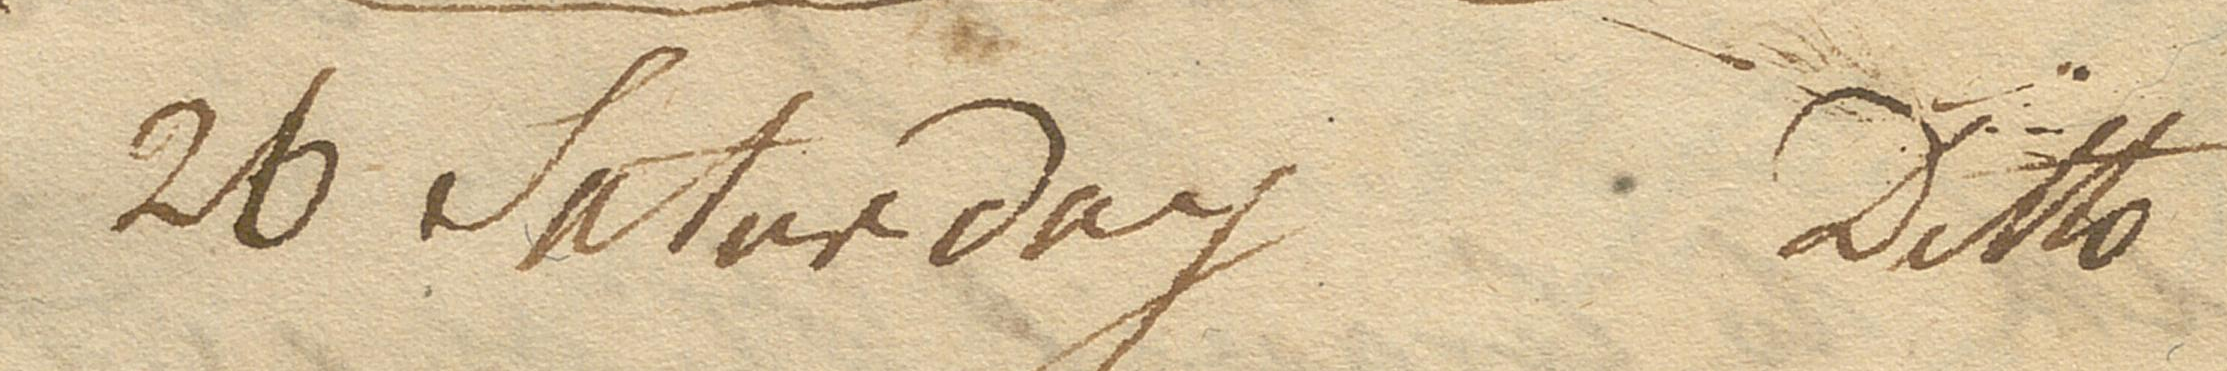26 Saturday Ditto
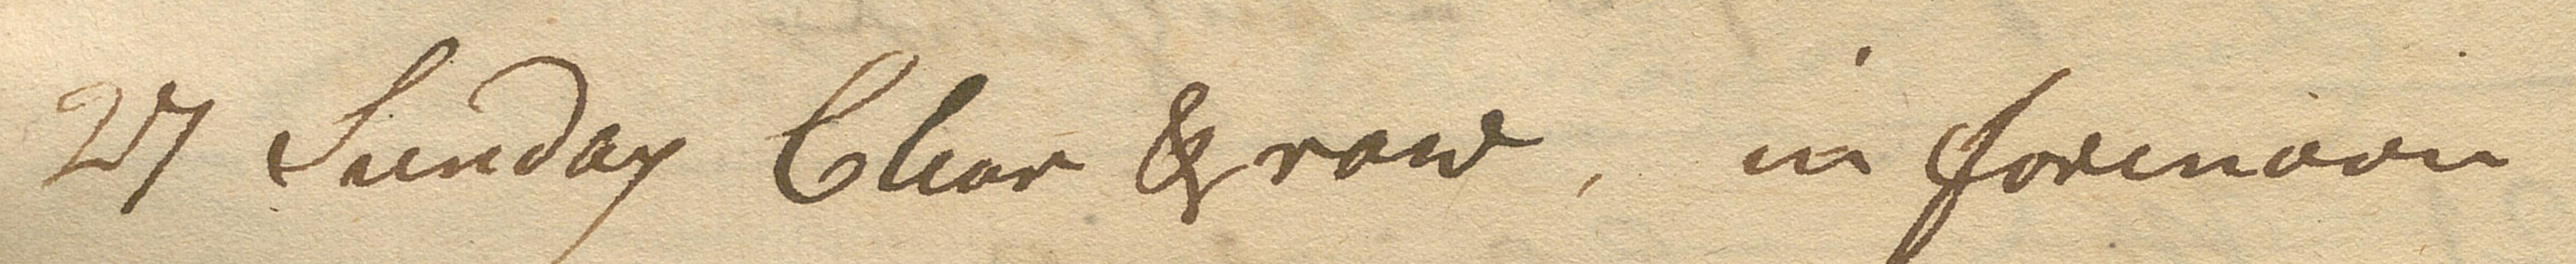27 Sunday Clear & raw, in forenoon
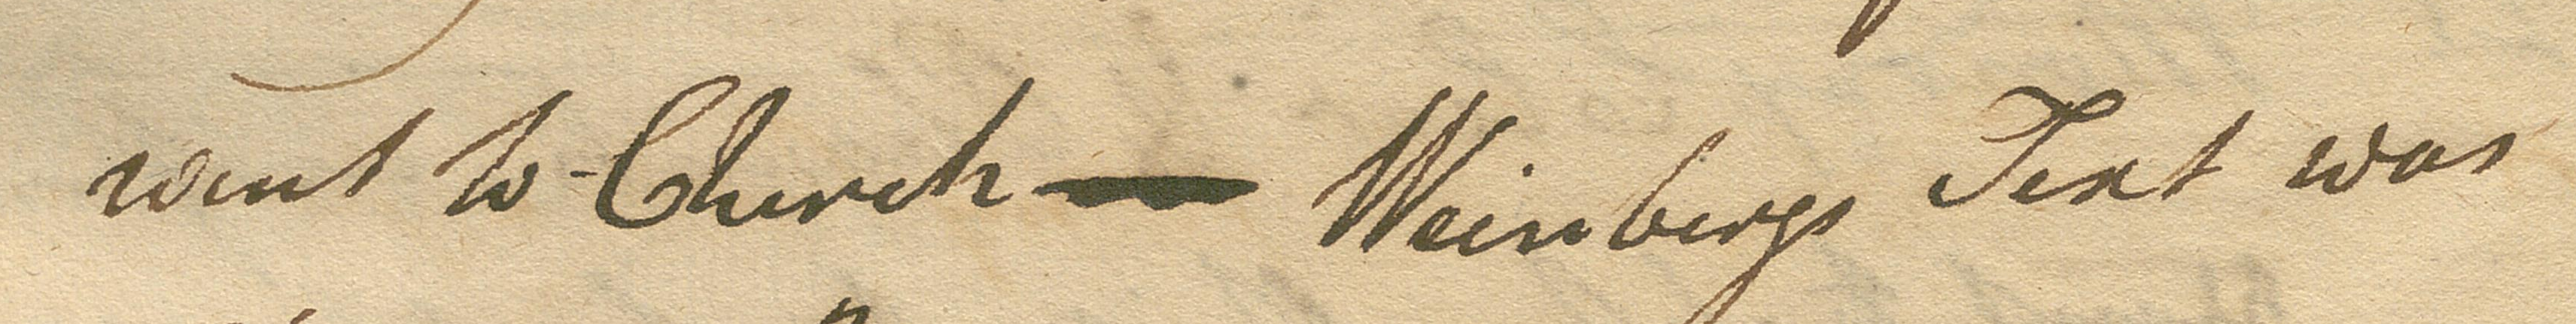went to Cherch- Weinberys Text was
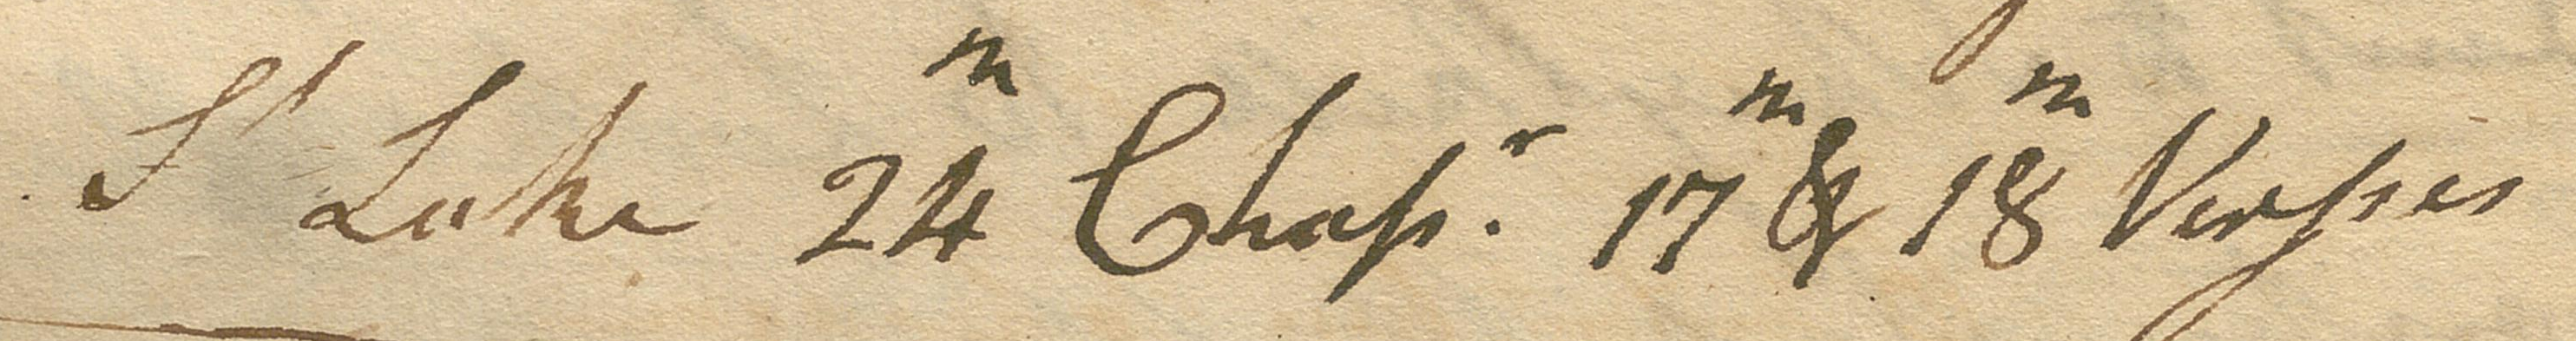S^t Luke 24th Chap^t. 17^th & 18^th Verses
